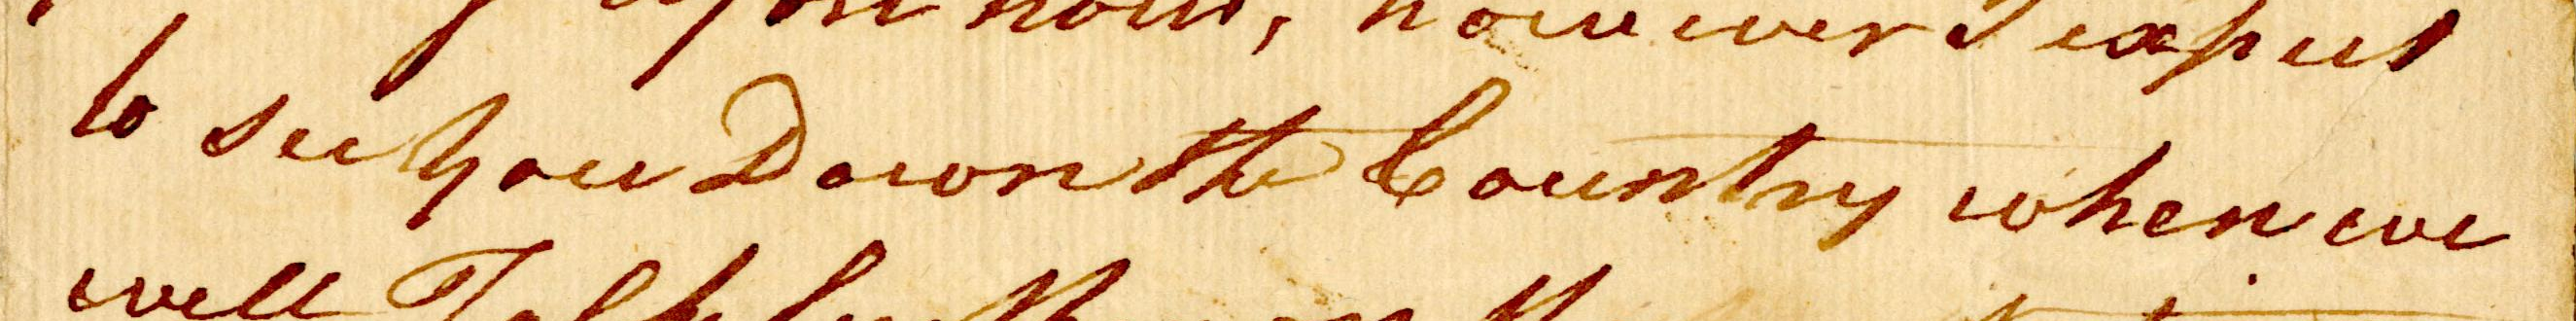to see you Down the Country when we
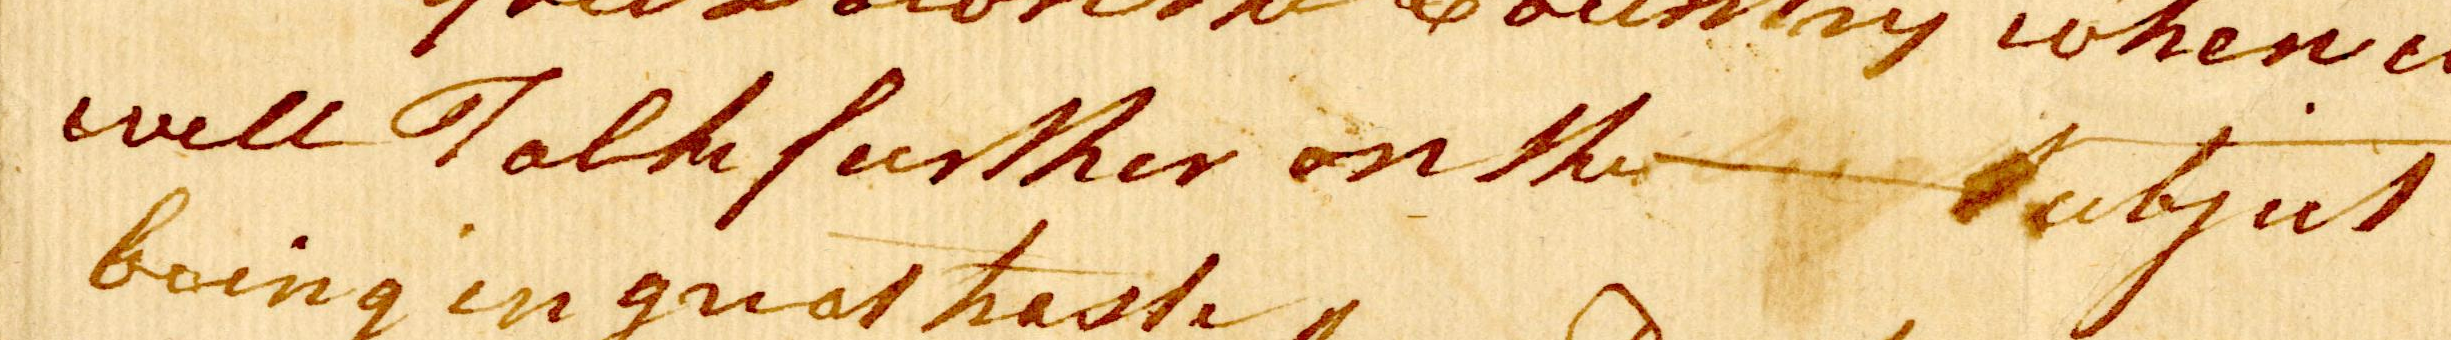well Talk further on the- subject
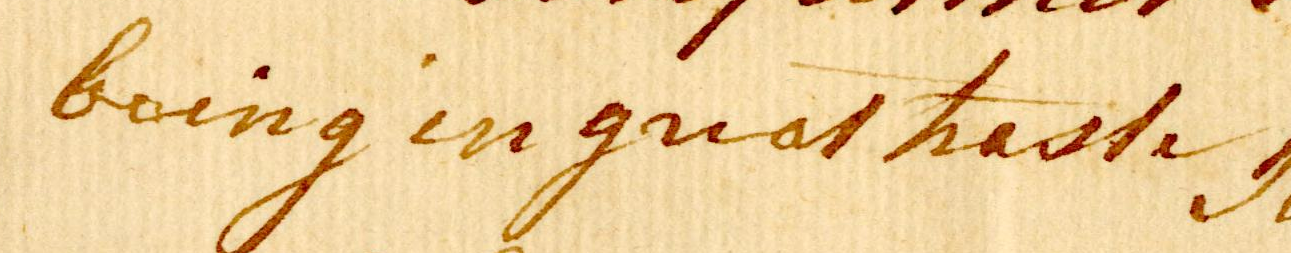being in great haste
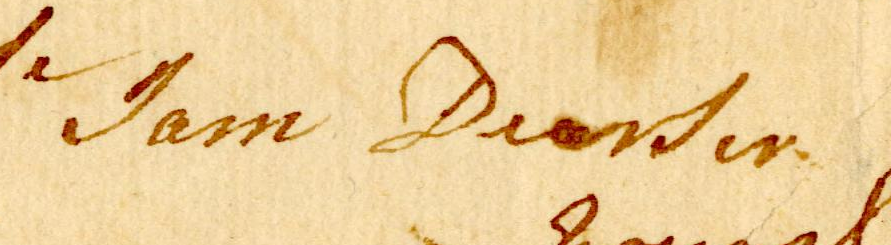I am Dear sir
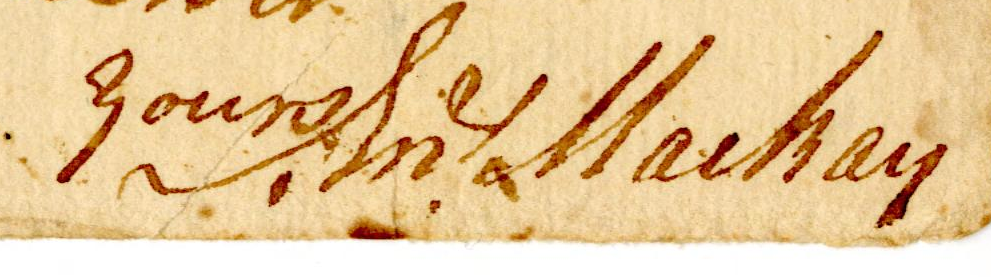Yours An^s Mackay
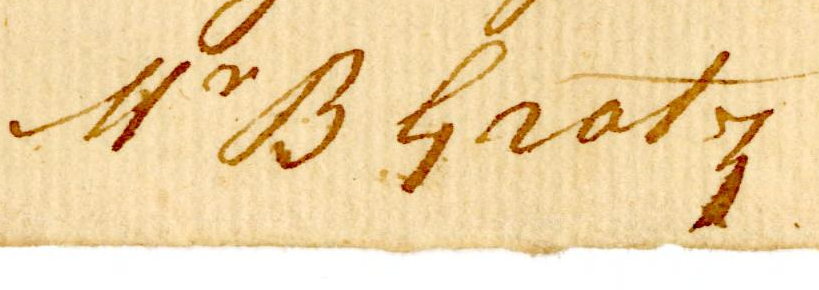M^r. B Gratz
